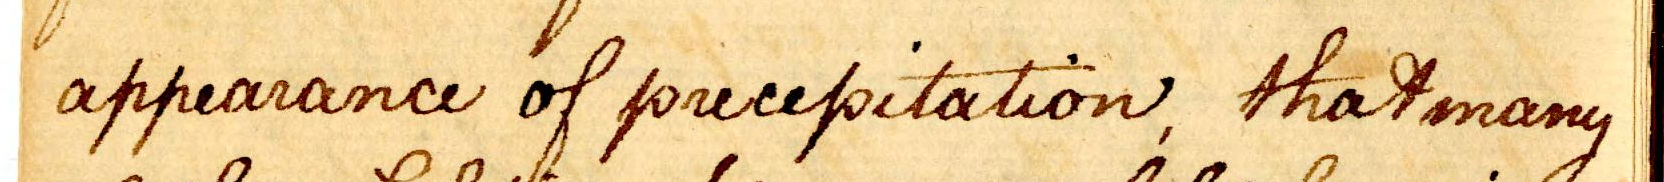appearance of precepitation, that many
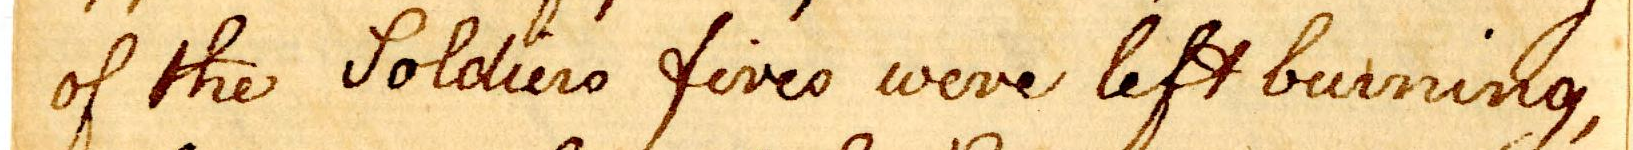of the Soldiers fires were left burning,
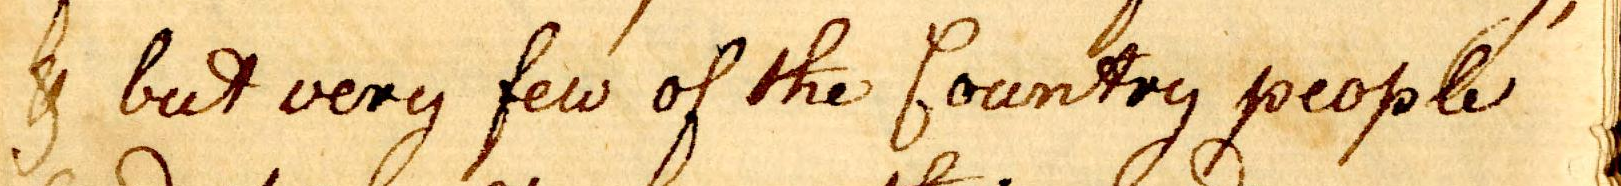& but very few of the Country people
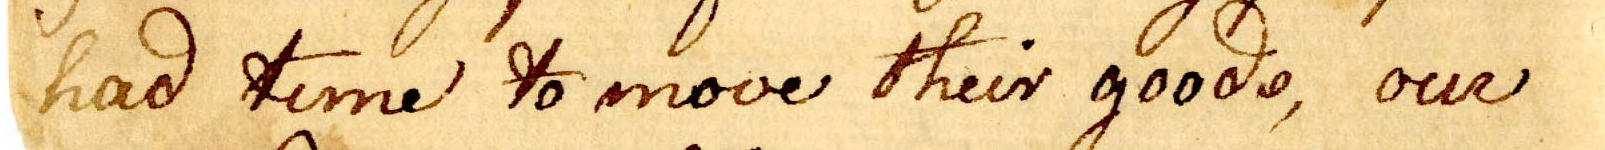had time to move their goods, our
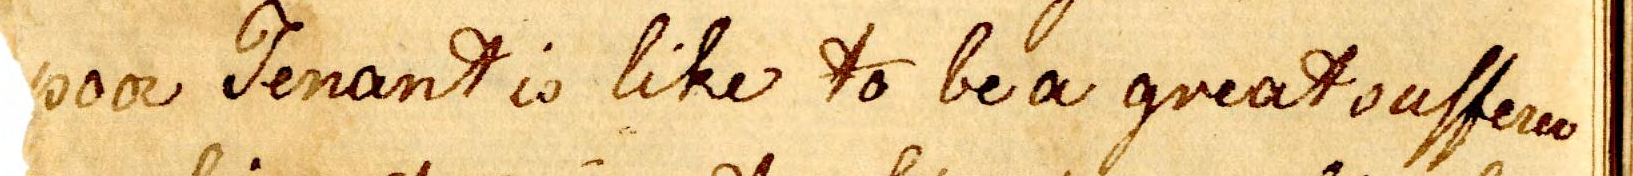poor Tenant is like to be a great sufferer
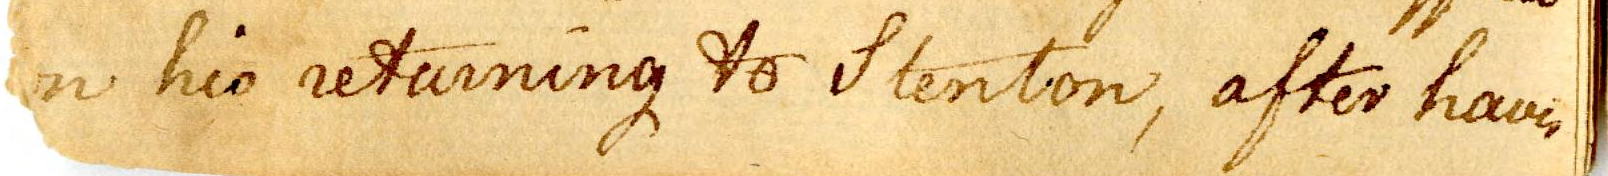in his returning to Stenton, after havin
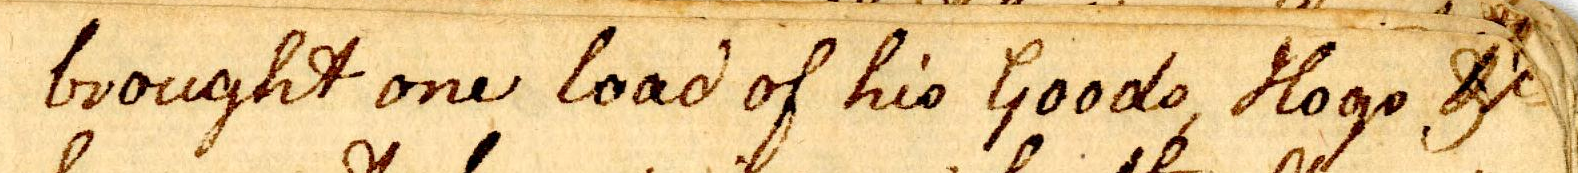brought one load of his Goods, Hogs &^c
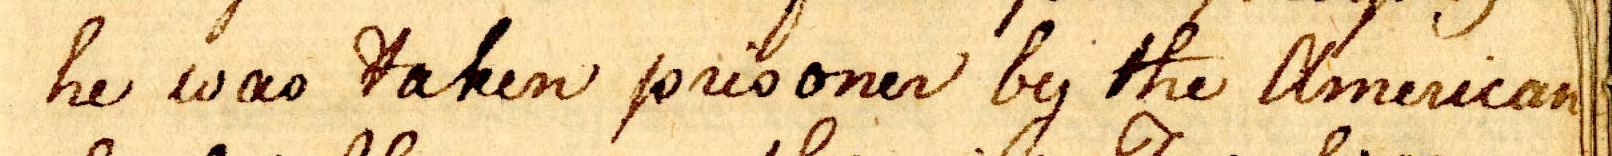he was taken prisoner by the American
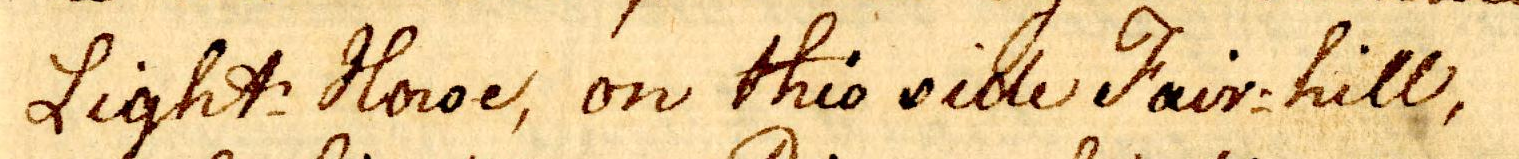Light-Horse, on this side Fair-hill,
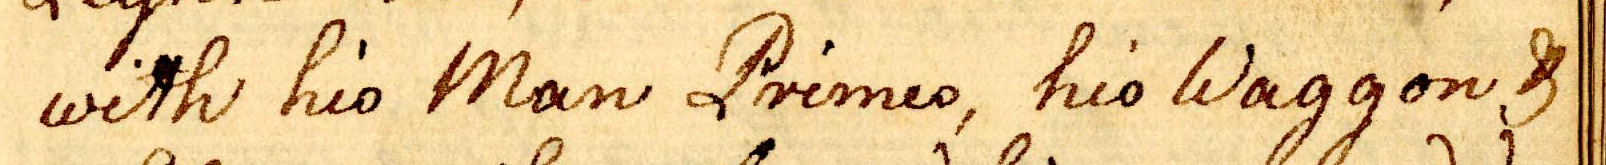with his Man Primes, his Waggon &
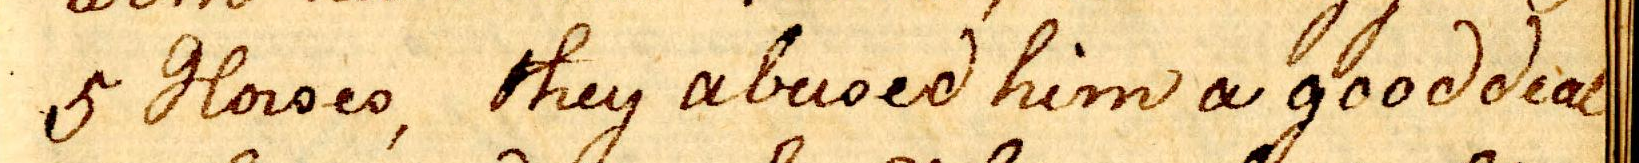5 Horses, they abused him a good deal
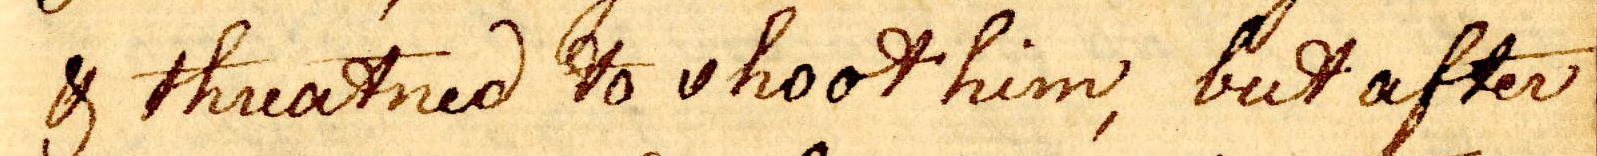& threatned to shoot him, but after
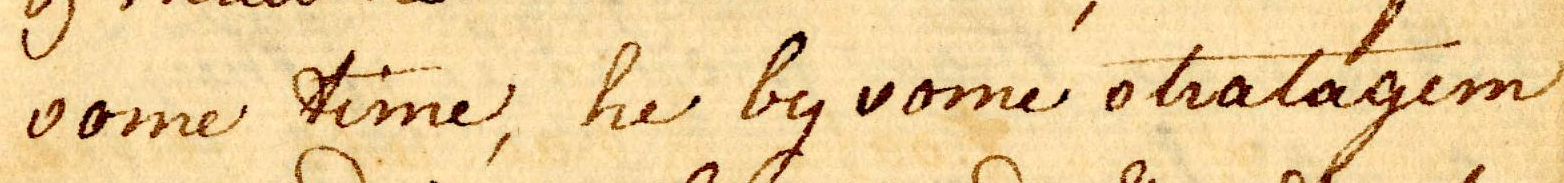some time, he by some stratagem
